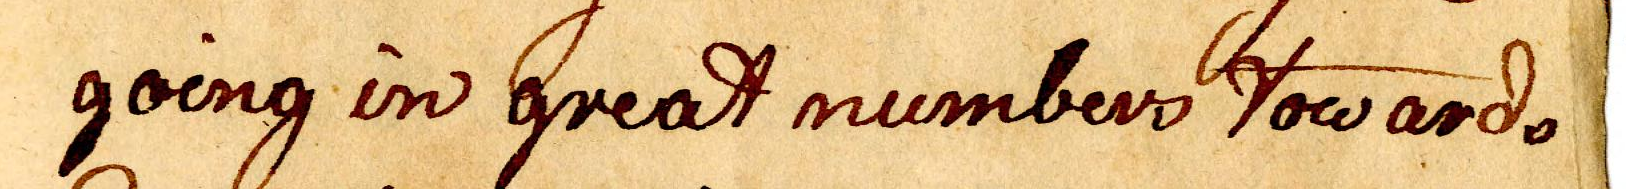going in great number towards
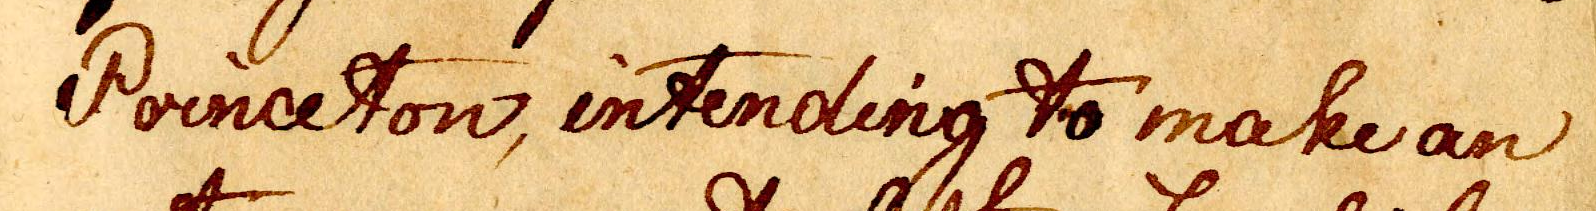Princeton, intending to make an
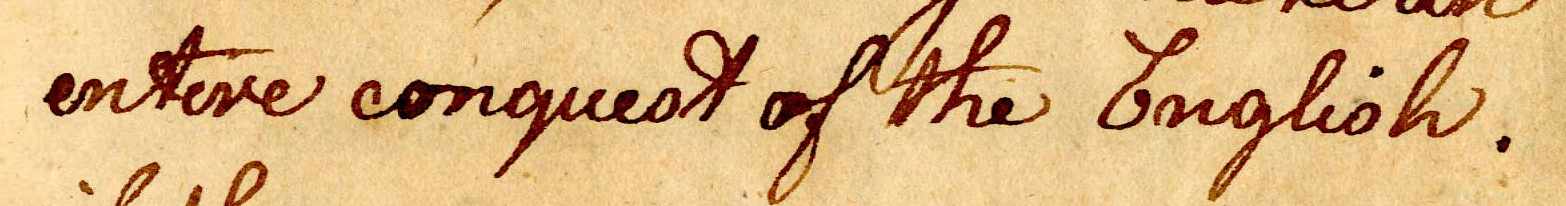entire conquest of the English.
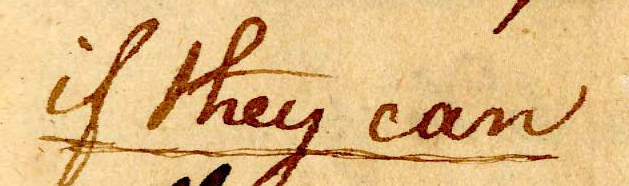if they can-
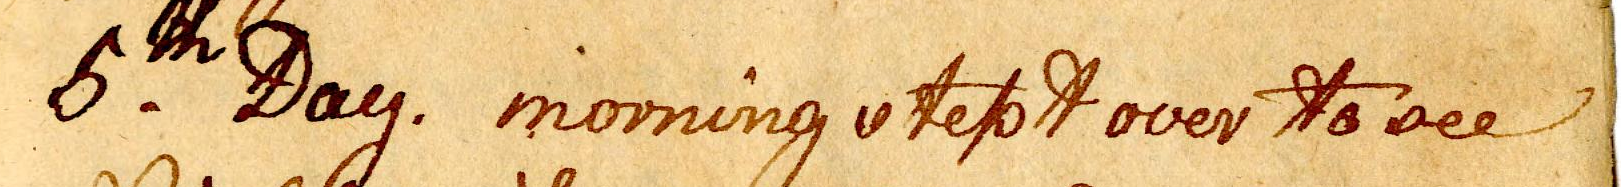5^th Day. morning stept over to see
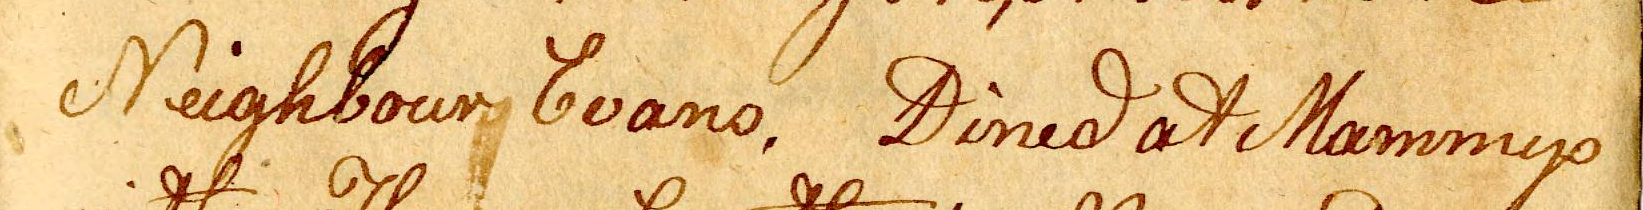Neighbor Evans, Dined at Mammys
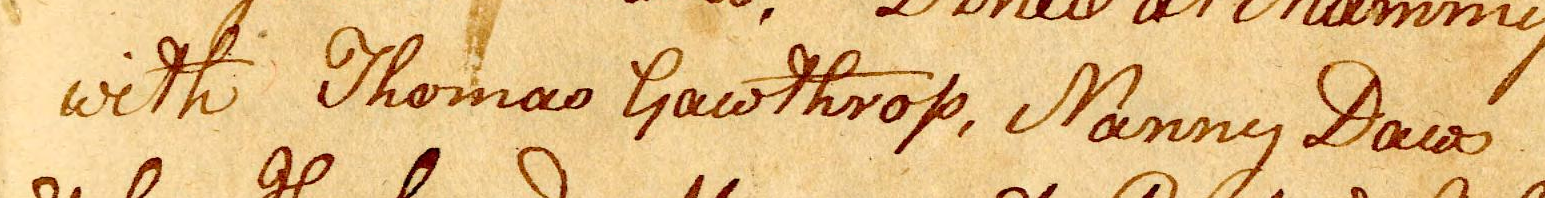with Thomas Gawthrop, Nancy Daws
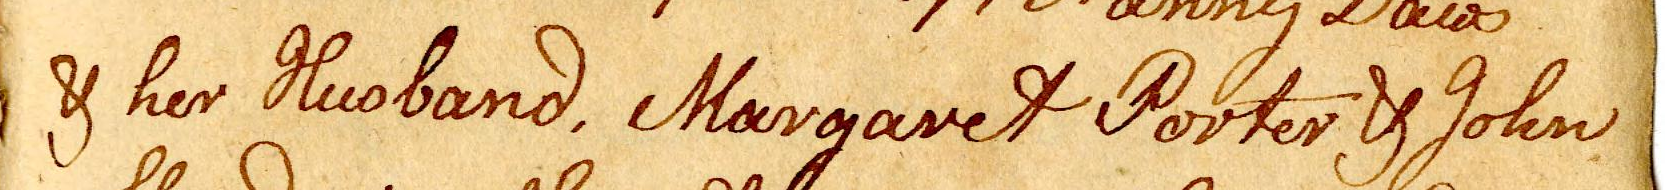& her Husband, Margaret Porter & John
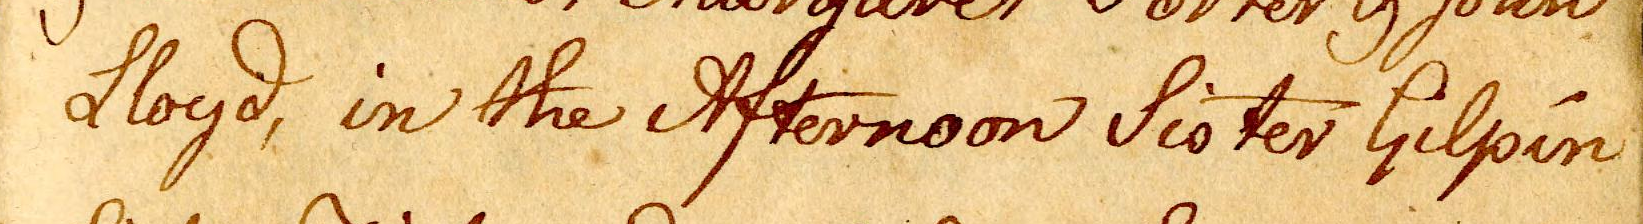Lloyd, in the Afternoon Sister Gilpin
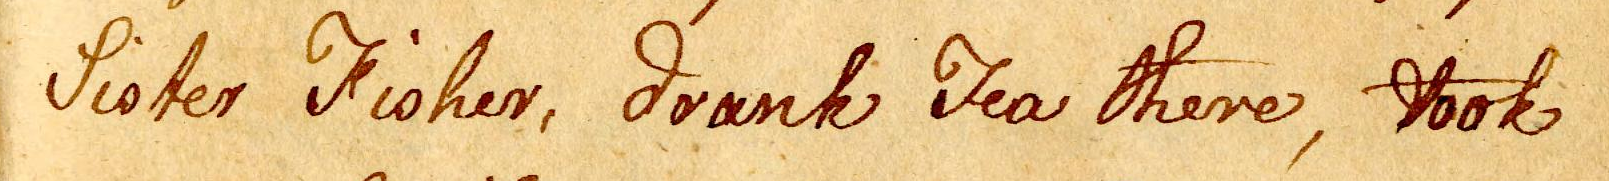Sister Fisher, drank Tea there, took
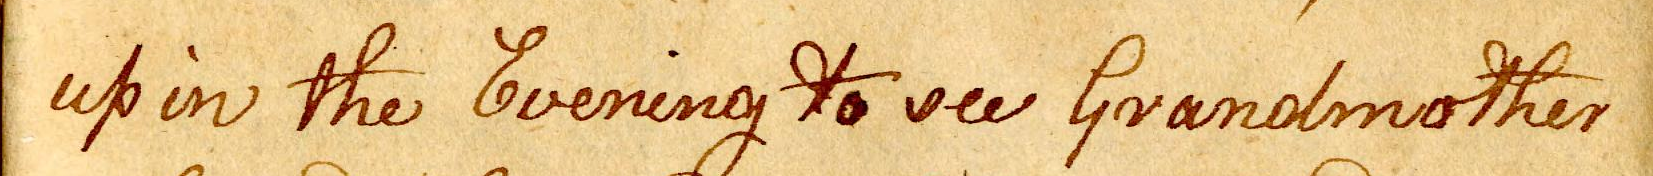up in the Evening to see Grandmother
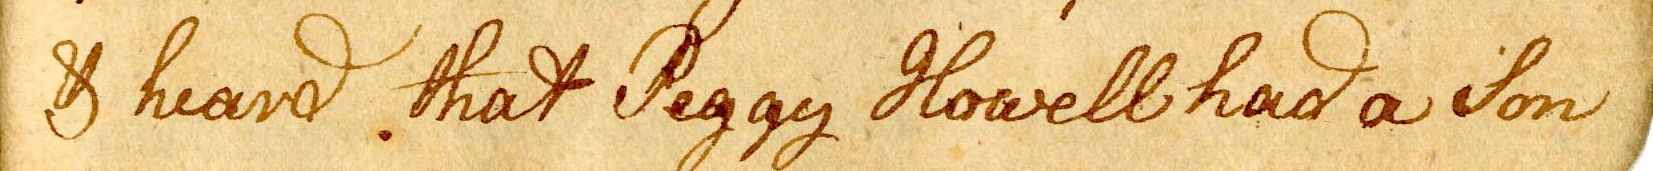& heard that Peggy Howell had a Son
